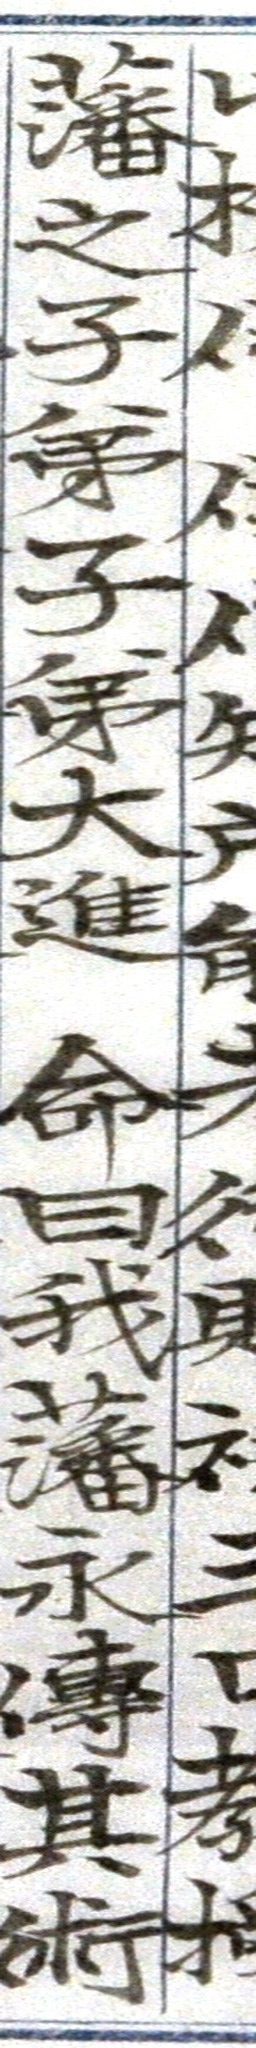藩之子第子第大進命曰我藩永博其術
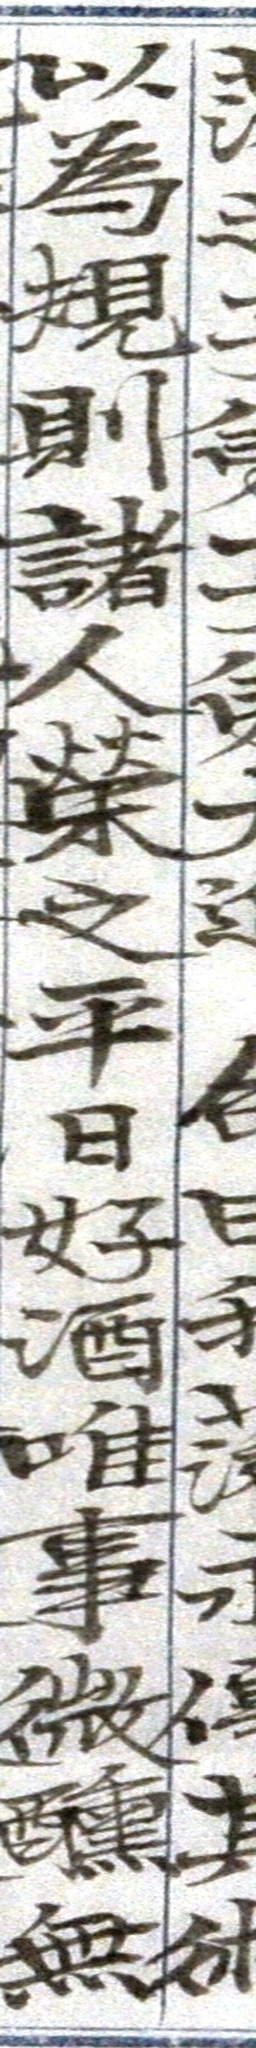以為規則諸人栄之平日好酒唯事微醺無
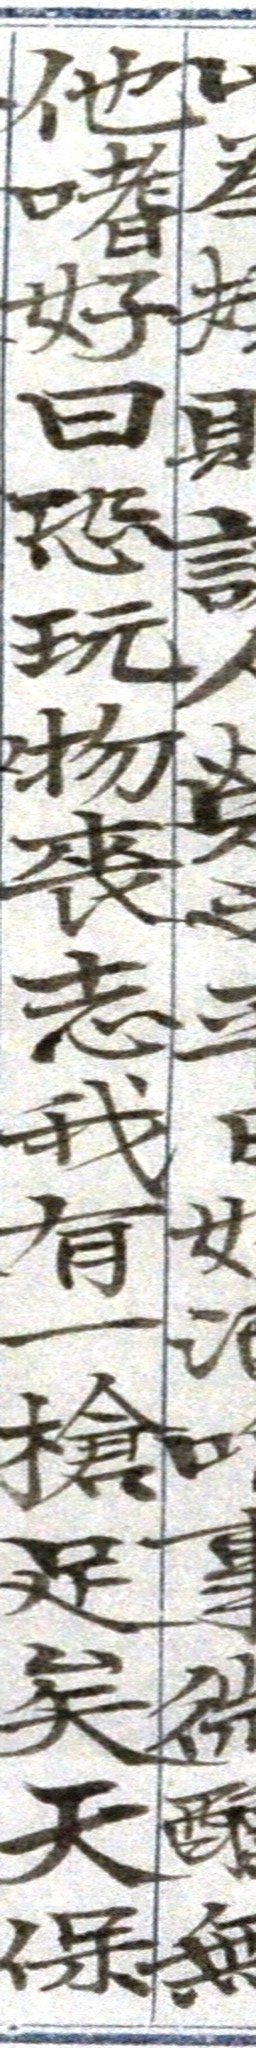他嗜好曰恐玩物喪志我有一槍足矣天保
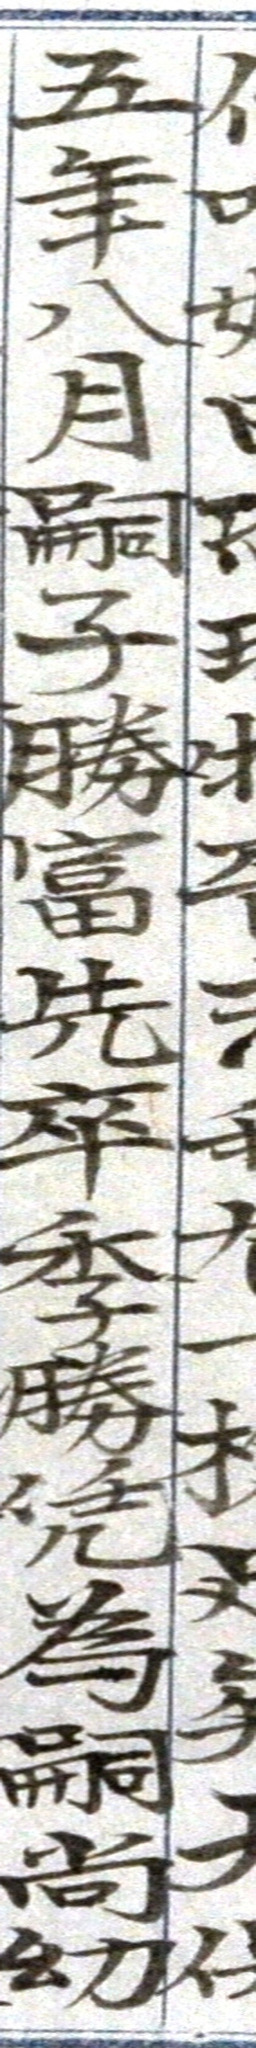五年八月嗣子勝富先卒季勝凭為嗣尚幼
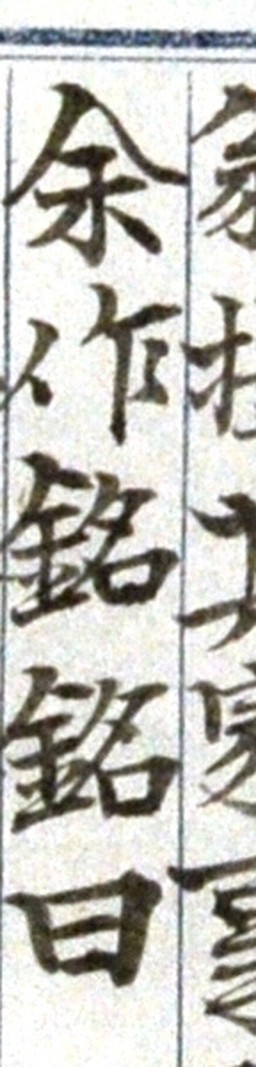余作銘銘曰
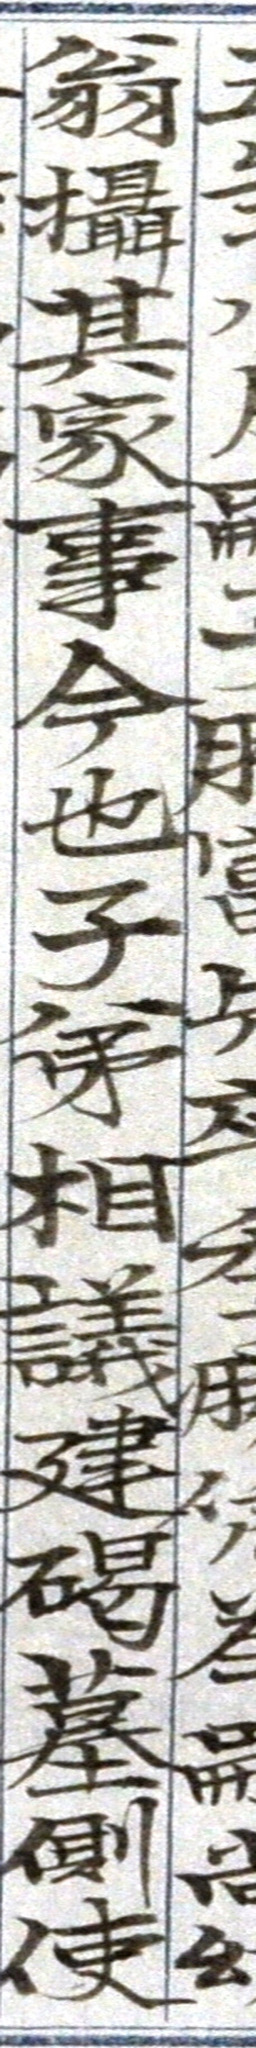翁摂其家事今也子第相議建碣墓側使
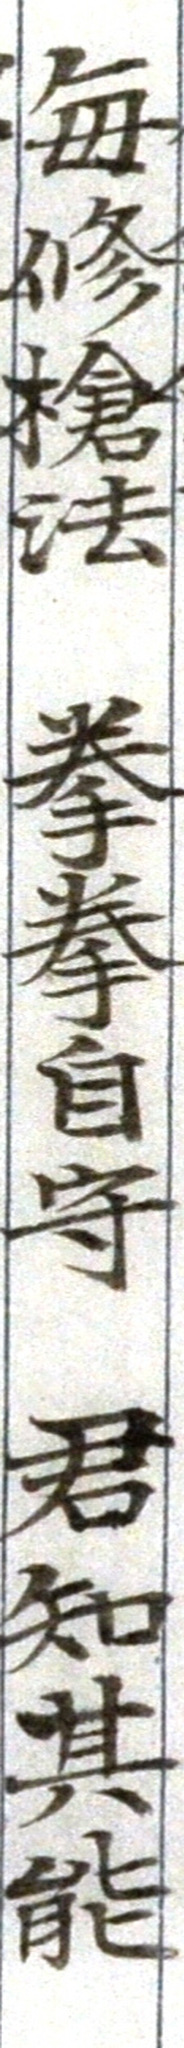毎修槍法拳拳自守君知其能
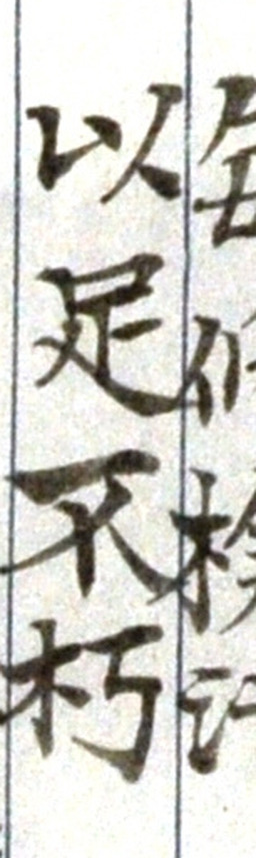以足不朽
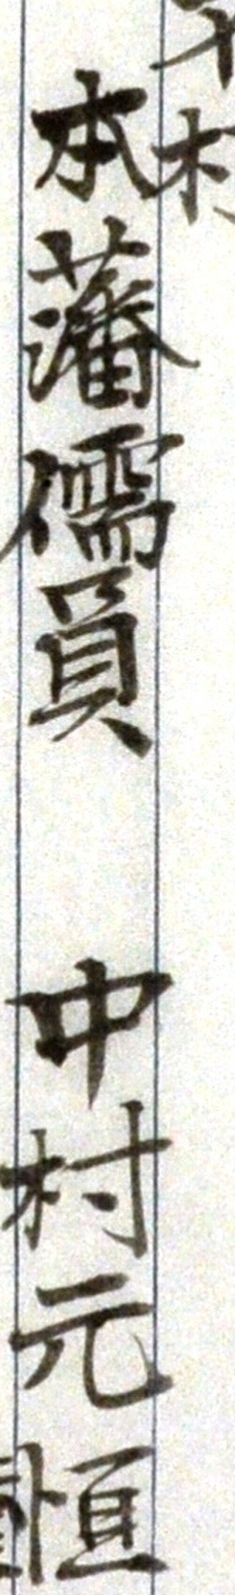本藩儒員中村元恒
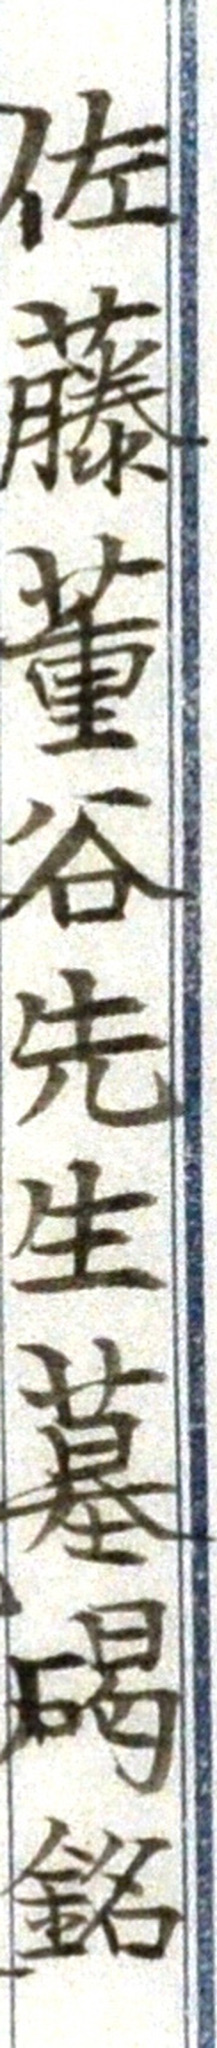佐藤薫谷先生墓碣銘
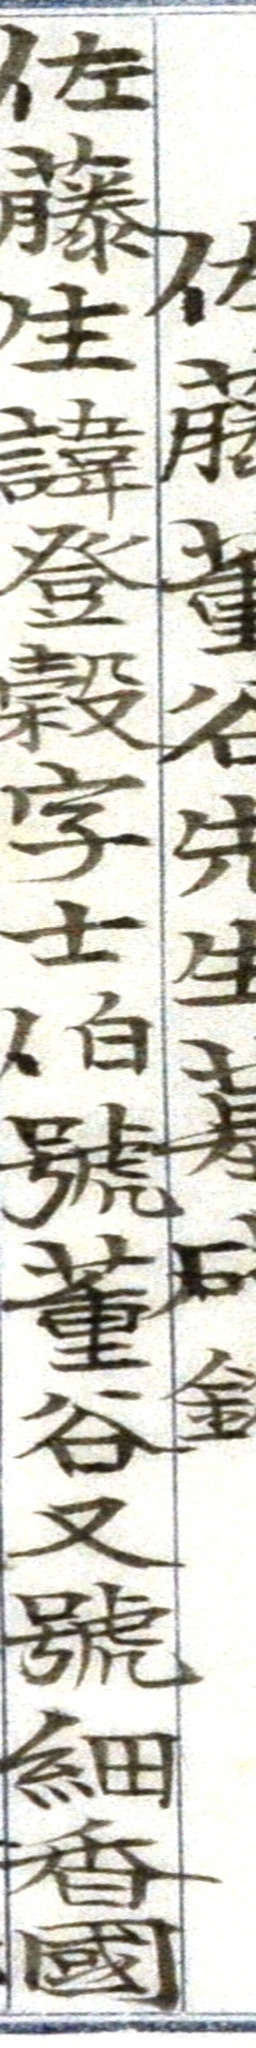佐藤生諱登穀字士伯号薫谷又号細香国
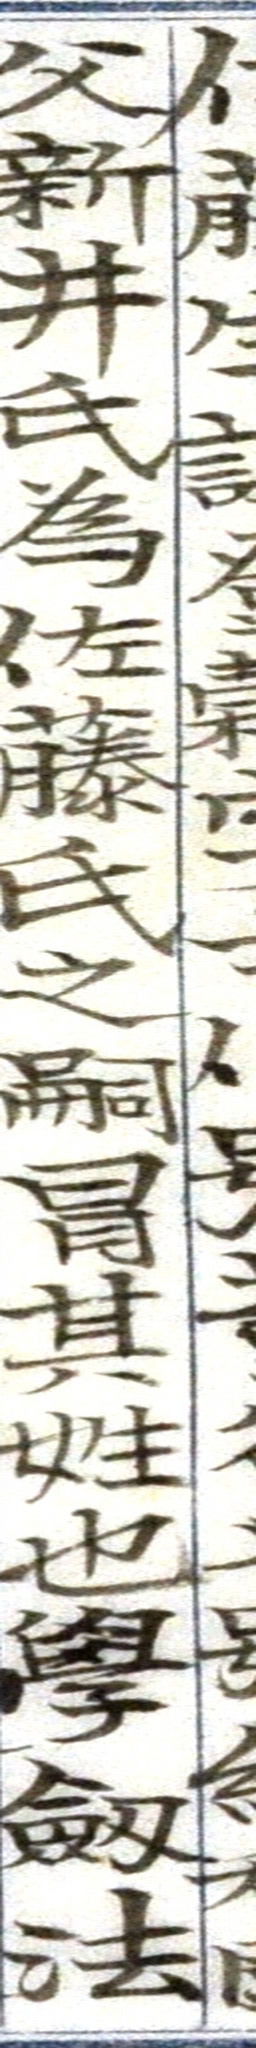父新井氏為佐藤氏之嗣其姓也学剣法
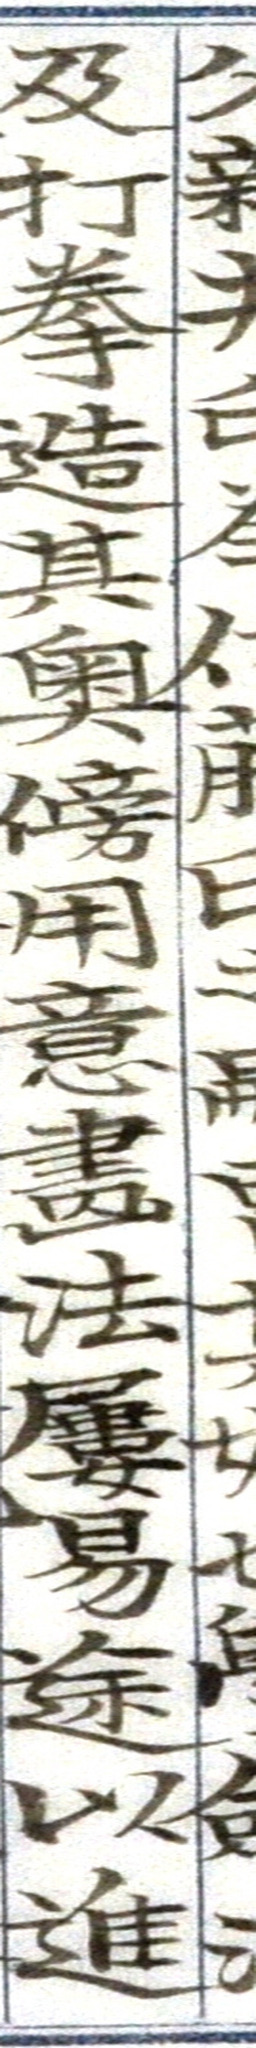及打拳造其奥傍用意尽法屡易途以進
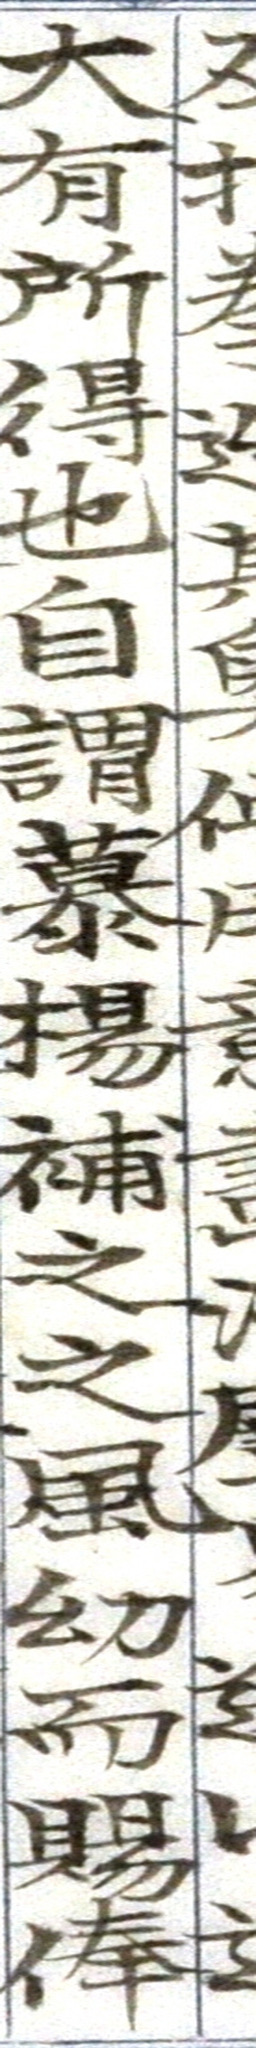大有所得也自謂慕楊補之之風幼而賜俸
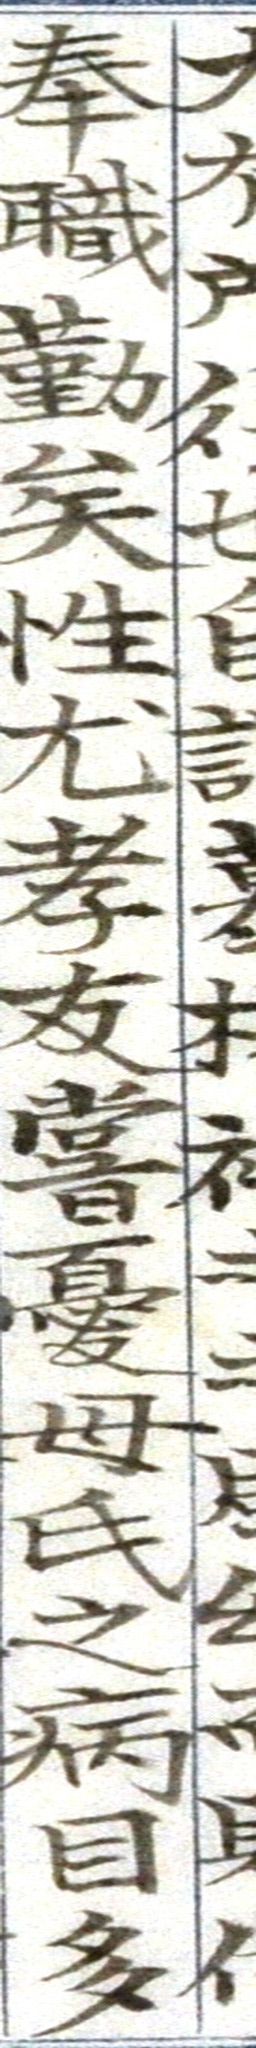奉職勤矣性尤孝友嘗憂母氏之病目多
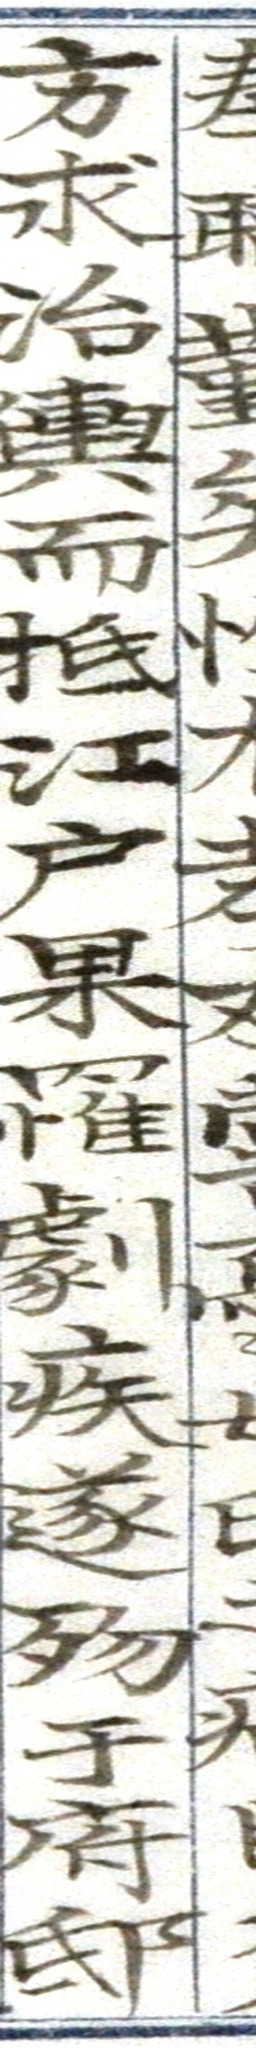方求治興而抵江戸果罹劇疾遂歾于府邸
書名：阿左見帰睡翁・佐藤薫谷先生碑文
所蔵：伊那市立高遠町図書館・合同会社AMANE
